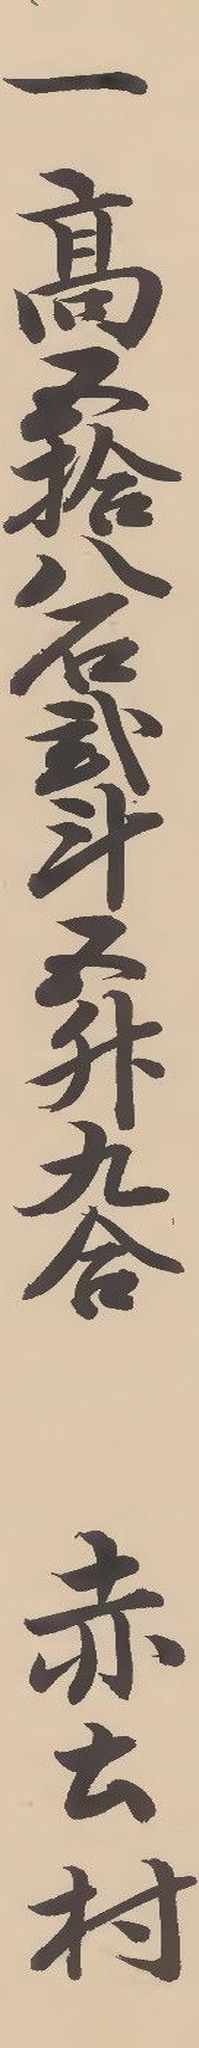一高五拾八石弐斗五升九合赤土村
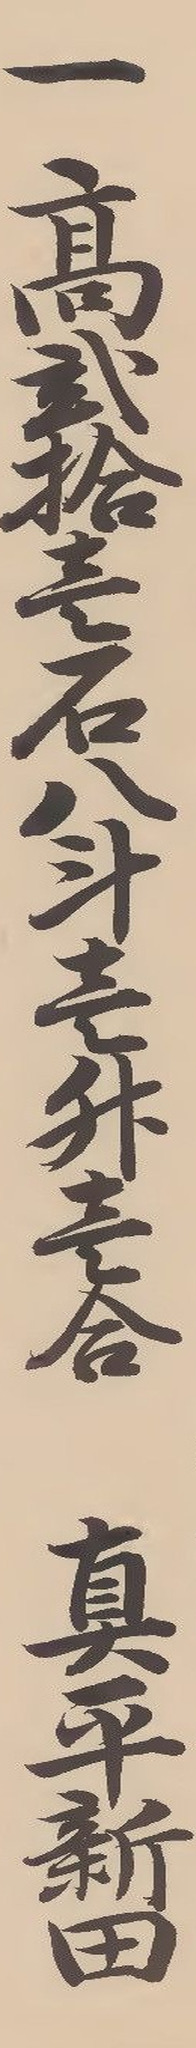一高弐拾壱石八斗壱升壱合真平新田
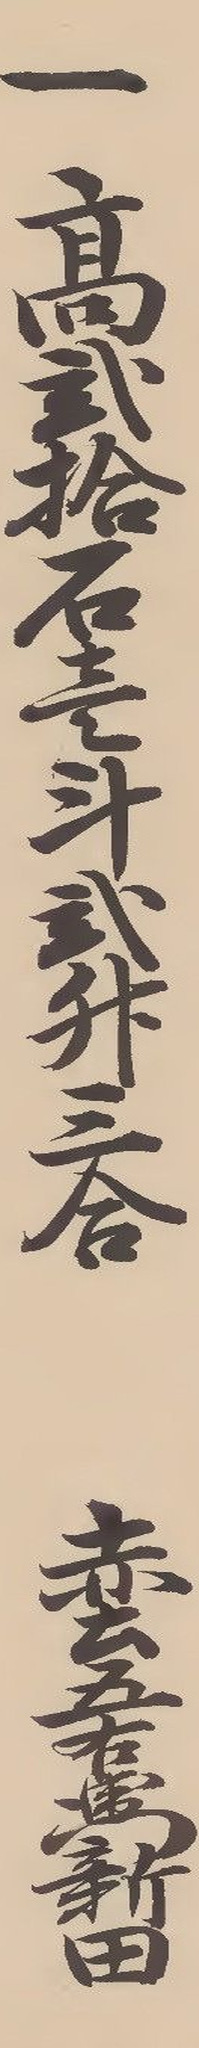一高弐拾石壱斗弐升三合赤土五右衛門新田

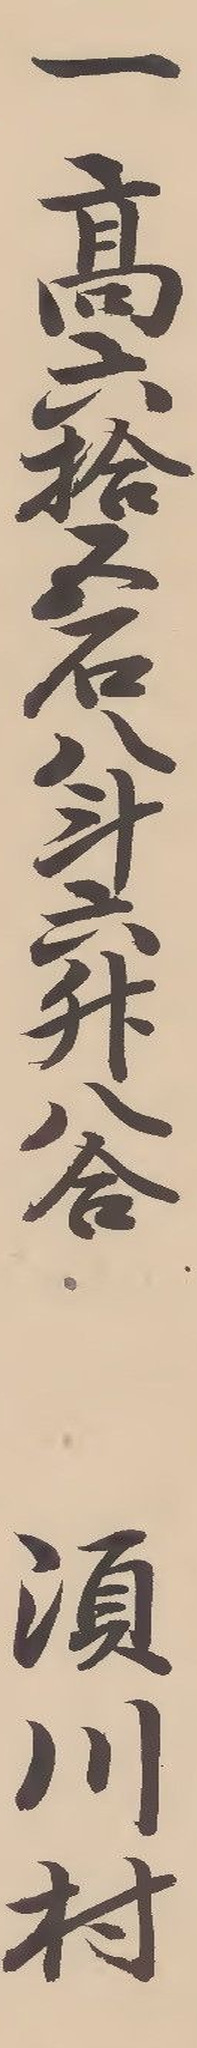一高六拾五石八斗六升八合須川村
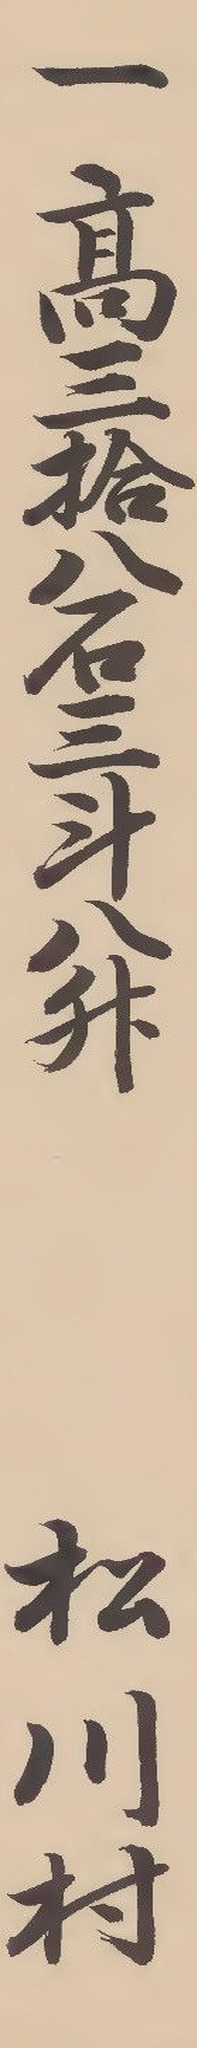一高三拾八石三斗八升松川村
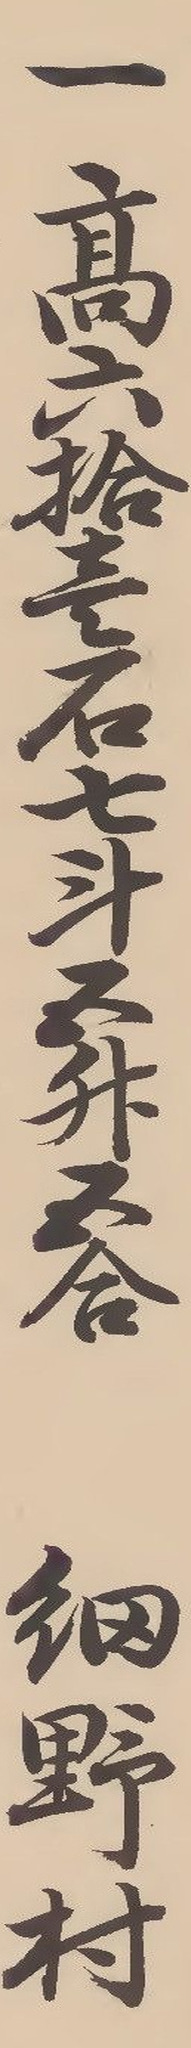一高六拾壱石七斗五升五合細野村
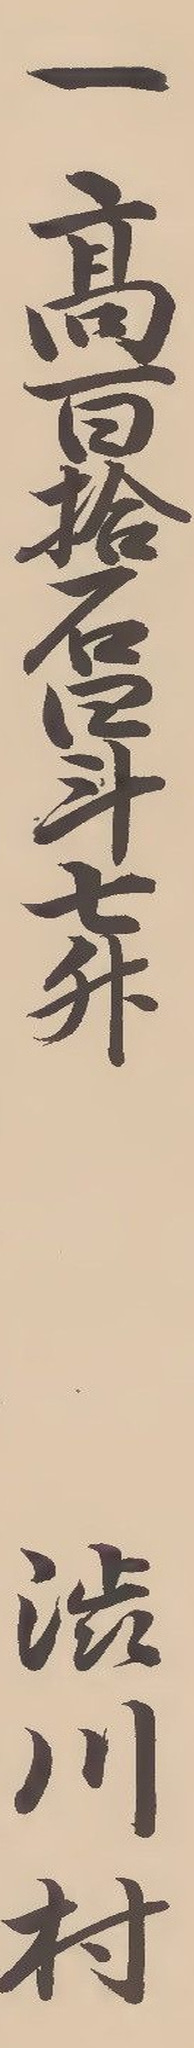一高百拾石四斗七升渋川村
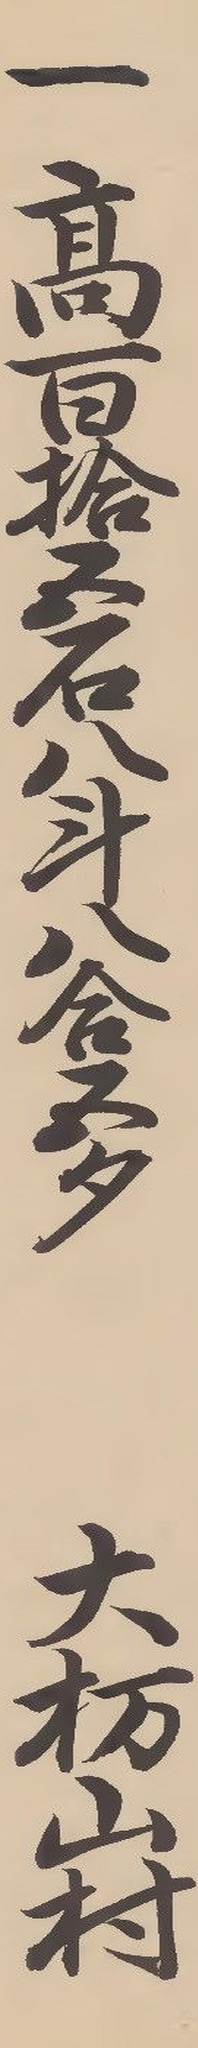一高百拾五石八斗八合五勺大栃山村
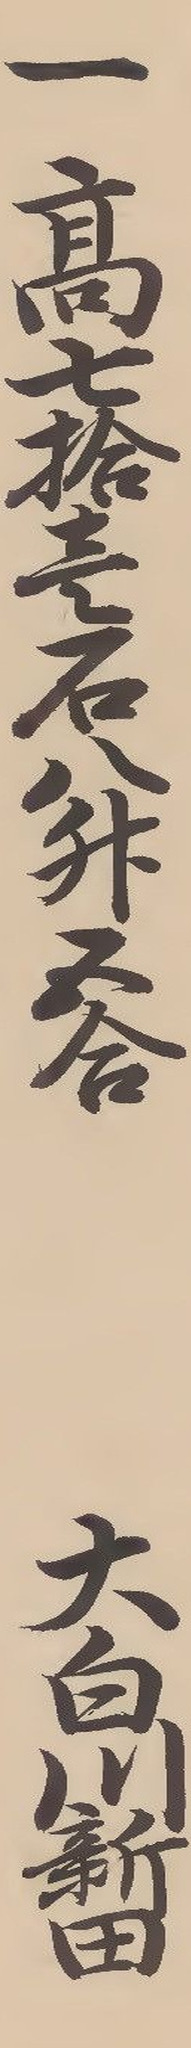一高七拾壱石八升五合大白川新田
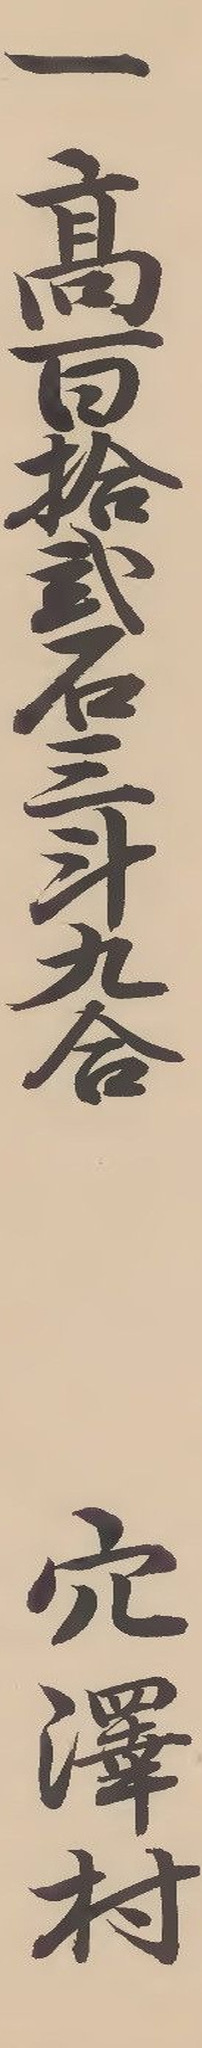一高百拾弐石三斗九合穴沢村
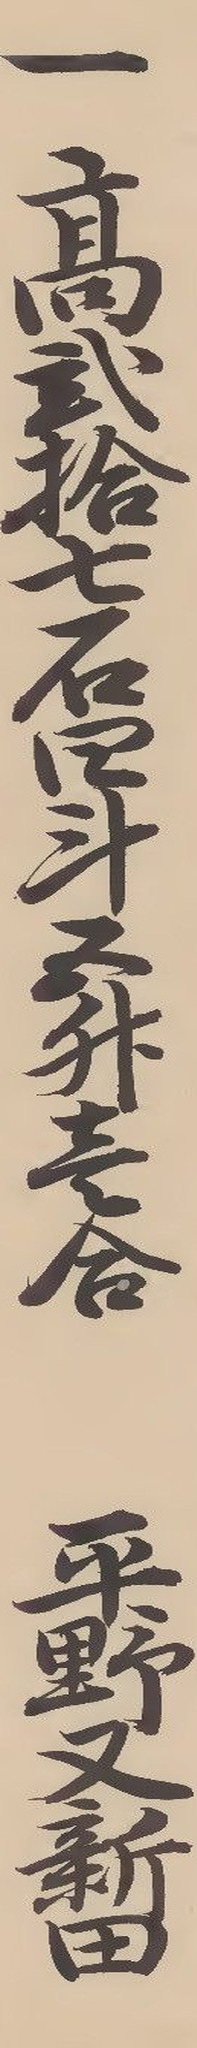一高弐拾七石四斗五升壱合平野又新田

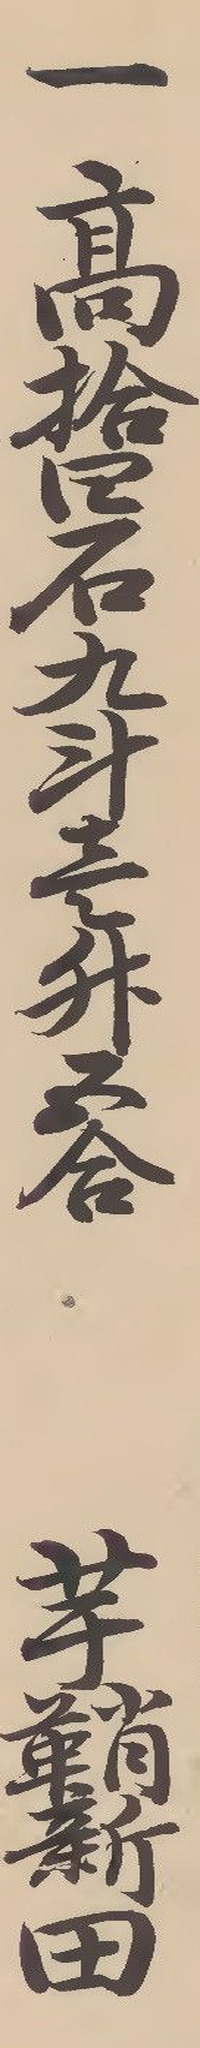一高拾四石九斗壱升五合芋鞘新田
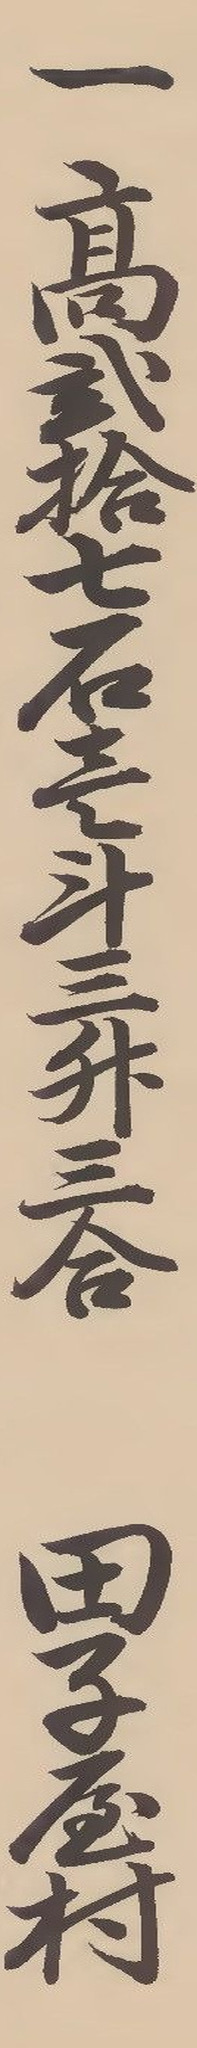一高弐拾七石壱斗三升三合田子屋村
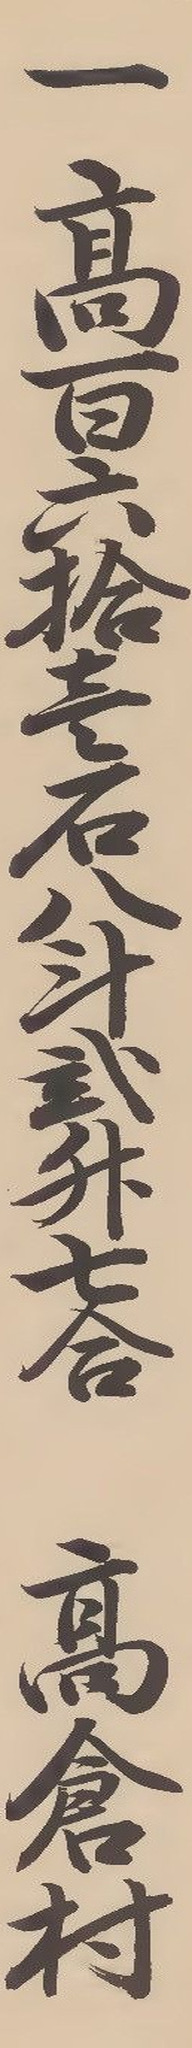一高百六拾壱石八斗弐升七合高倉村
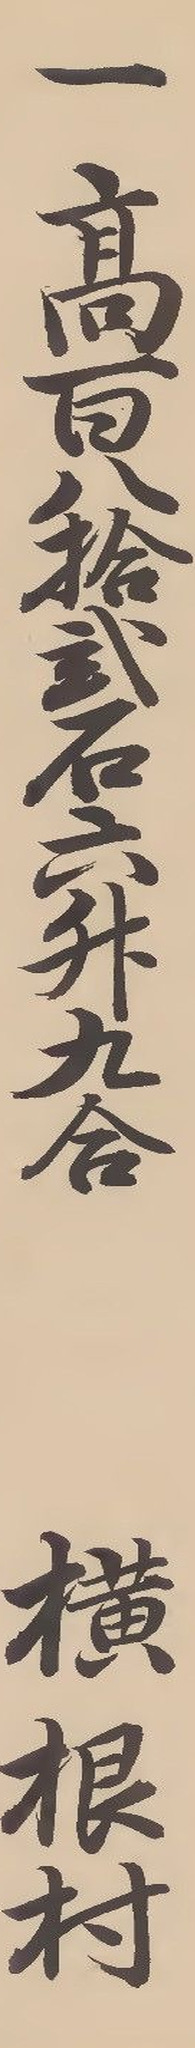一高百八拾弐石六升九合横根村
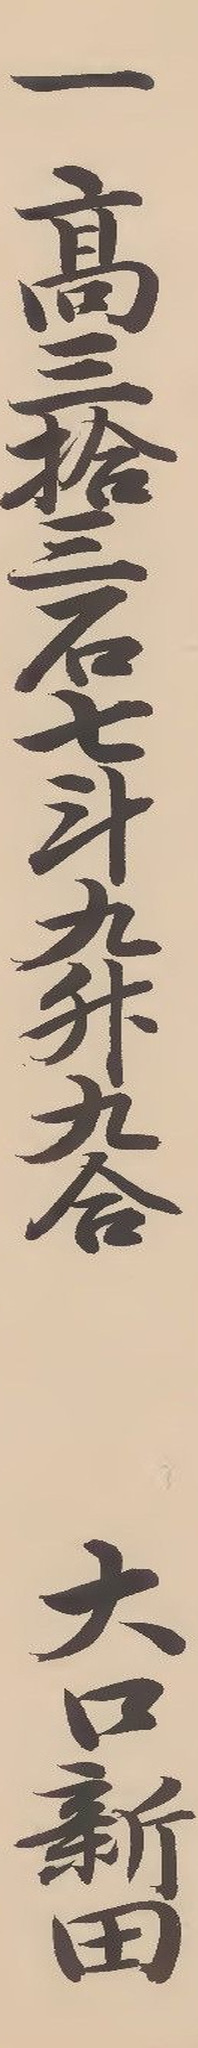一高三拾三石七斗九升九合大口新田
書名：越後国郷帳　中
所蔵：国立公文書館 National Archives of Japan
